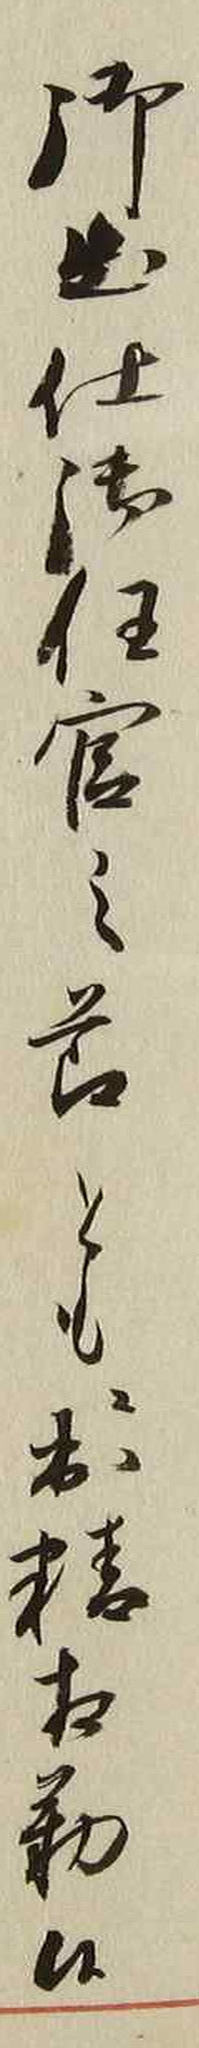御出仕御任官之節ともニ出精相勤候
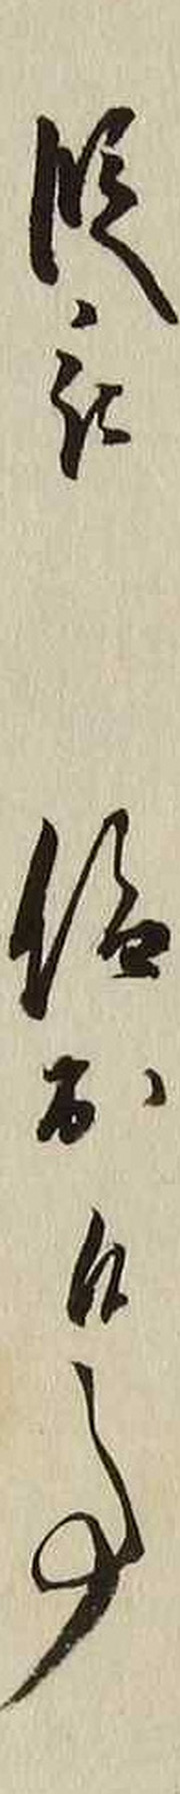段被仰出候事
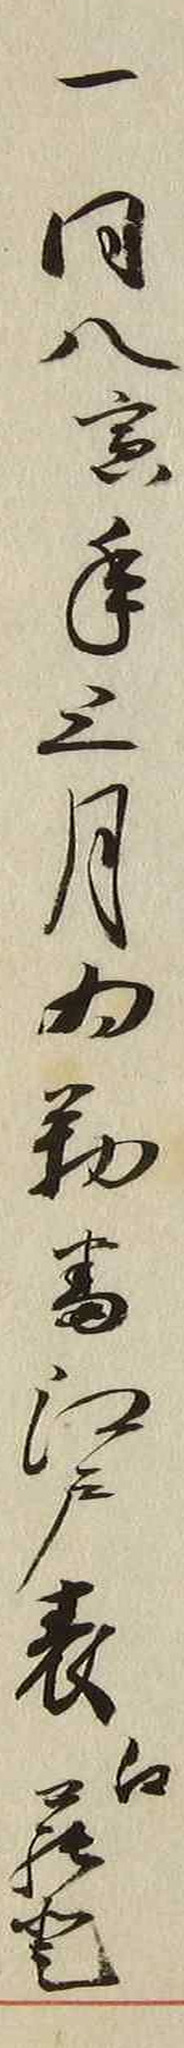一同八寅年三月為勤番江戸表江罷登
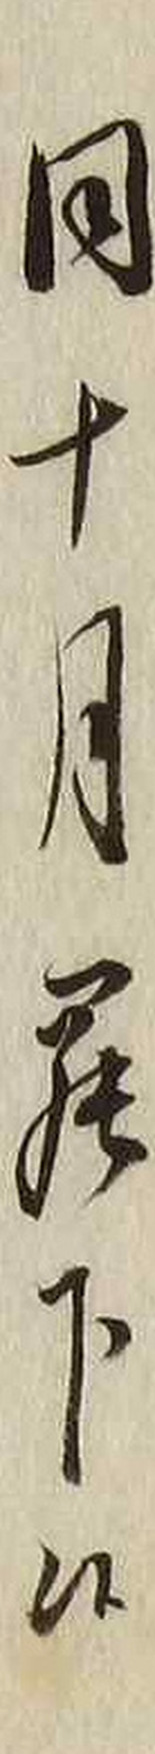同十月罷下候
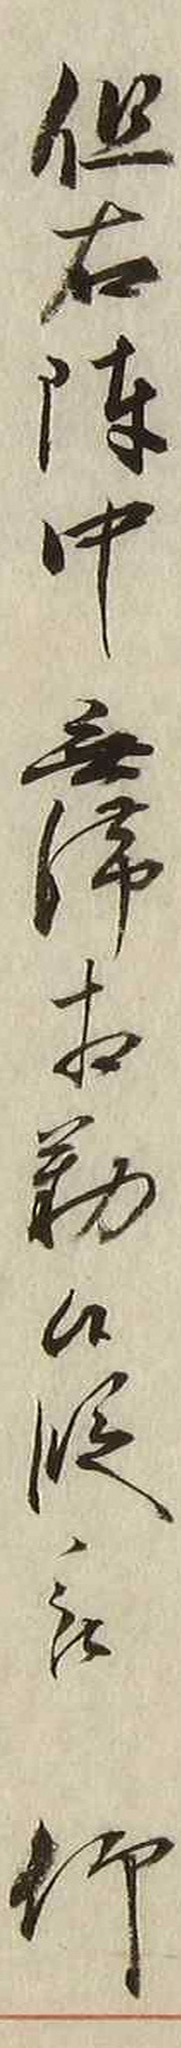但右陣中無滞相勤候段被仰
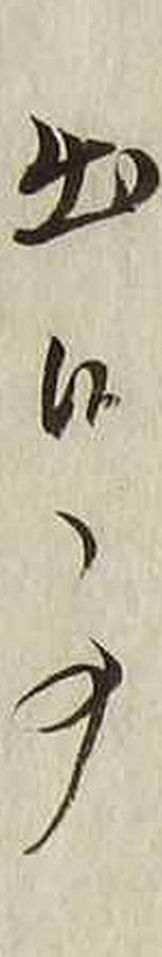出候事
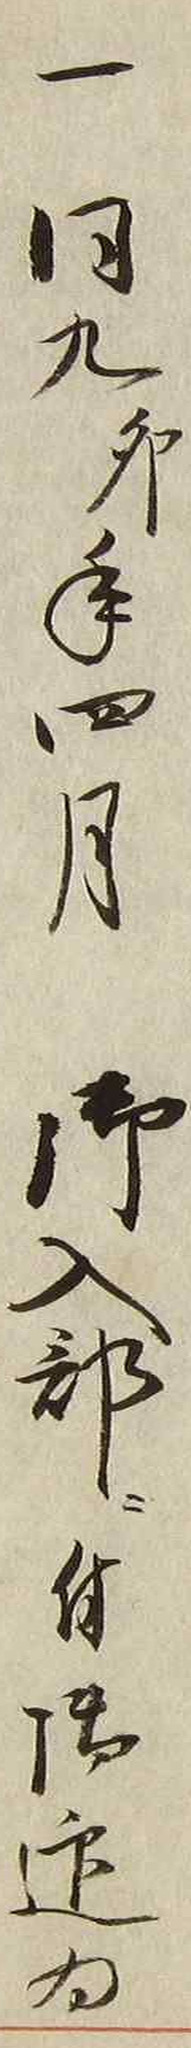一同九卯年四月御入部ニ付御迎為
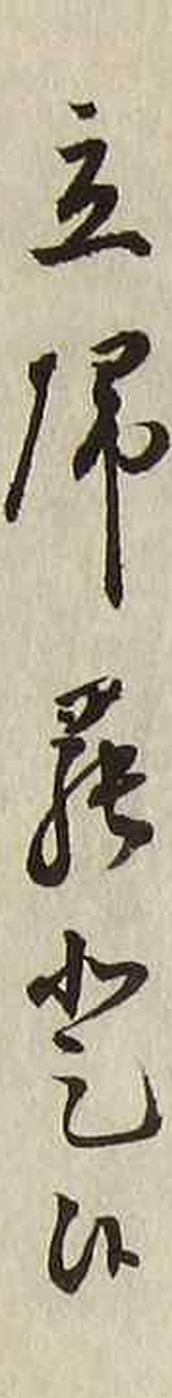立婦罷登候
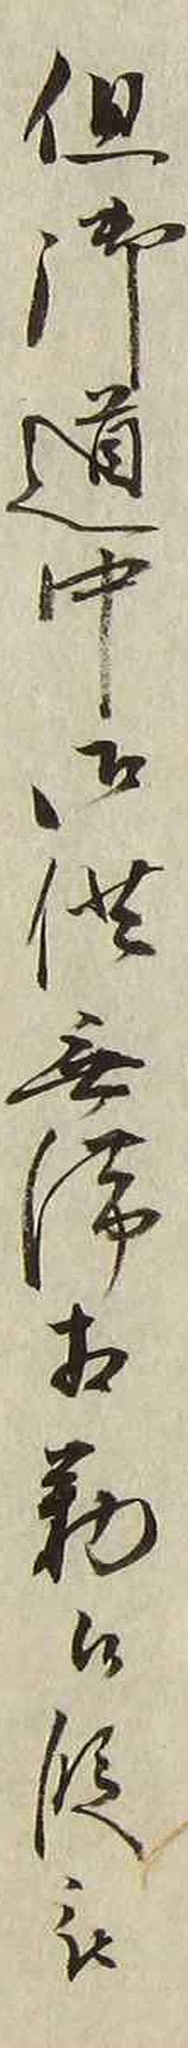但御道中御供無滞相勤候段被
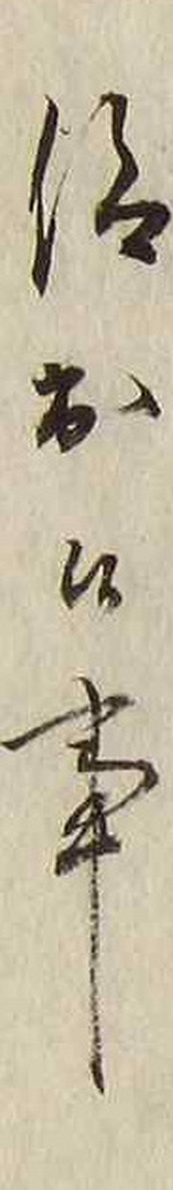仰出候事

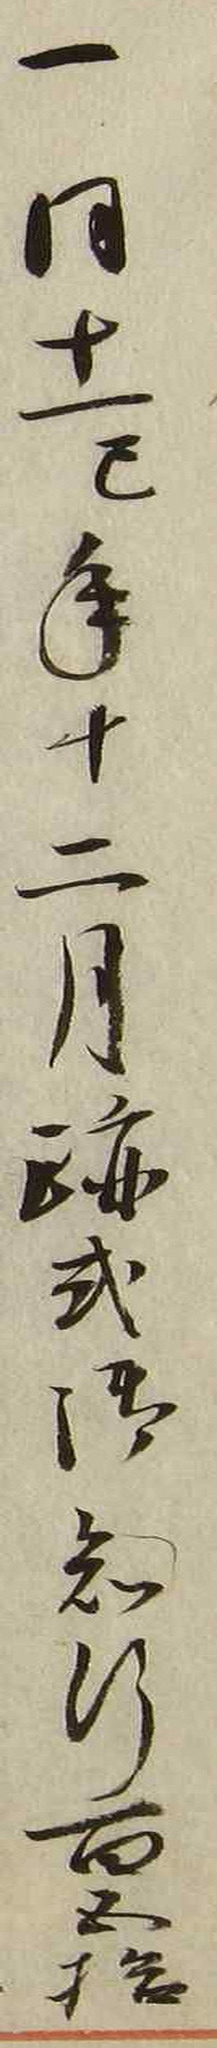一同十一巳年十二月跡式御知行百五拾
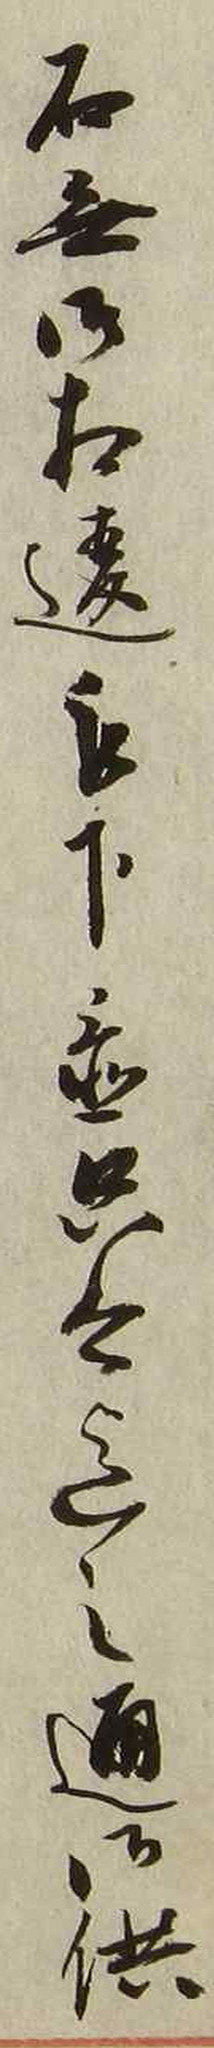石無御相違被下置只今迄之通御供
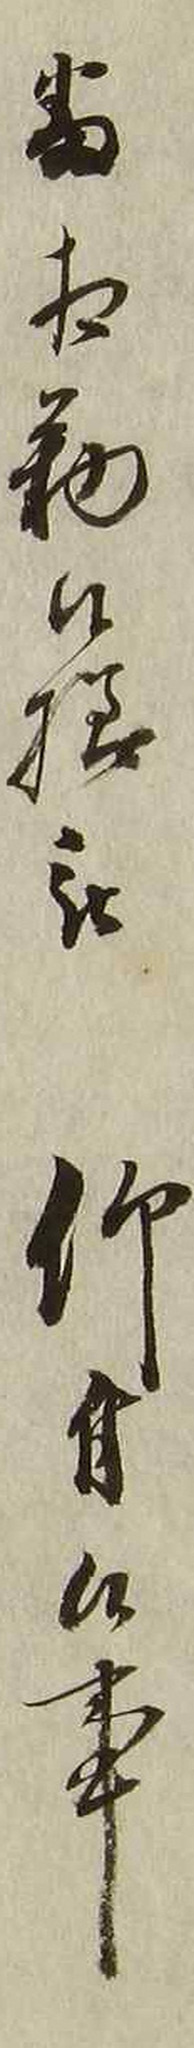番相勤候様被仰付候事
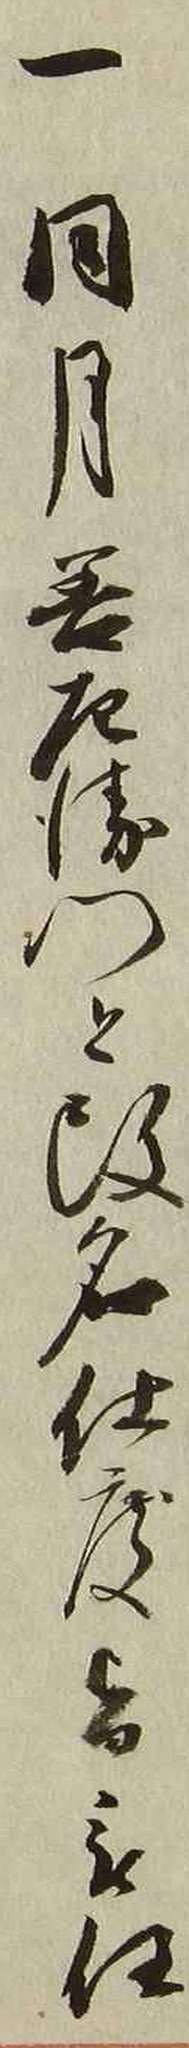一同月善左衛門と改名仕度旨被任
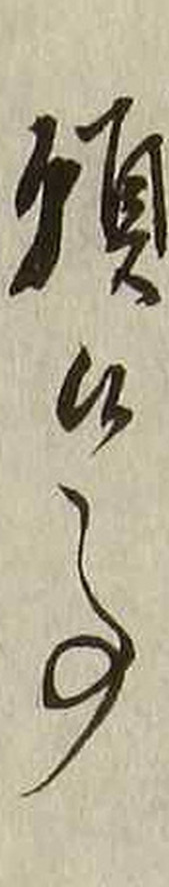願候事
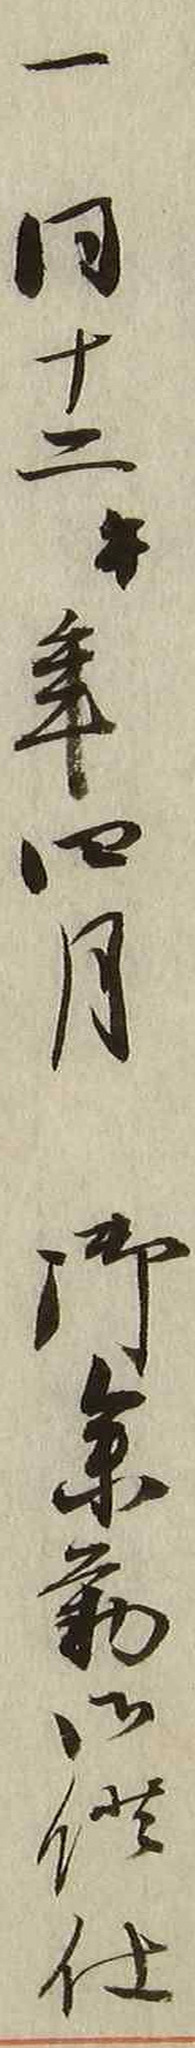一同十二午年四月御参勤御供仕
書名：諸士系譜　巻之22　い之部22
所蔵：会津若松市立会津図書館
